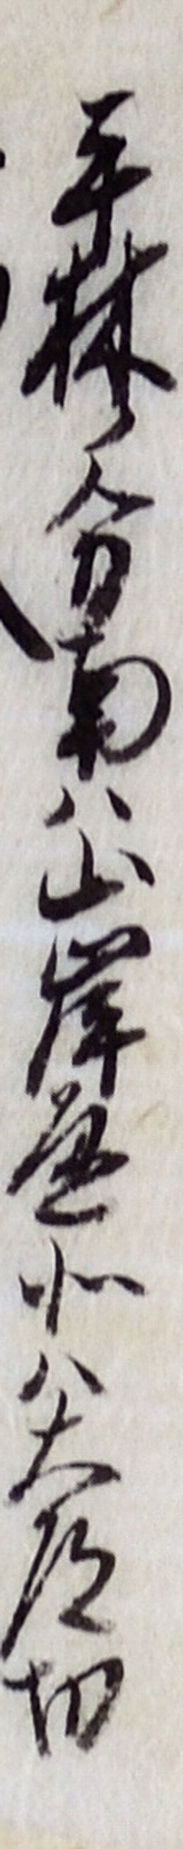平林分南ハ山岸辺北ハ大道切

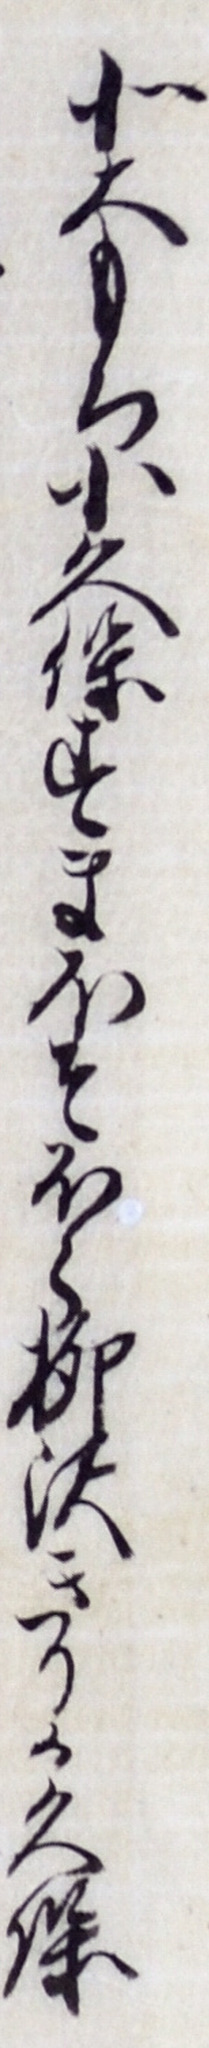北大もち小久保すまほそほく柳沢きりか久保

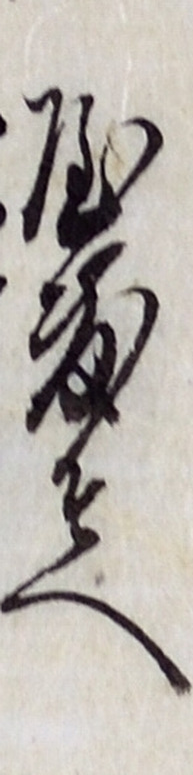屋敷そへ

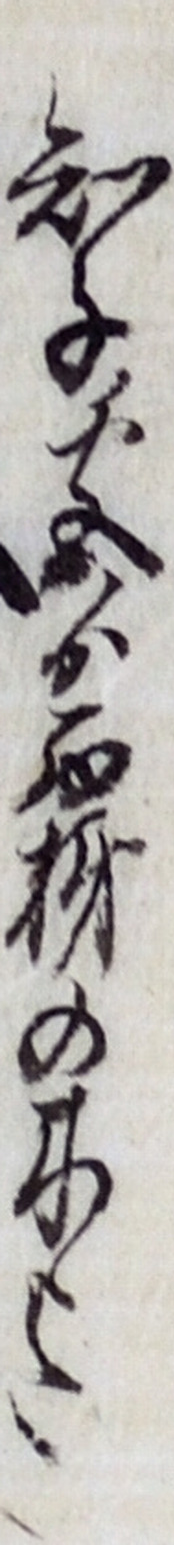知子宮ゟ西の木迄

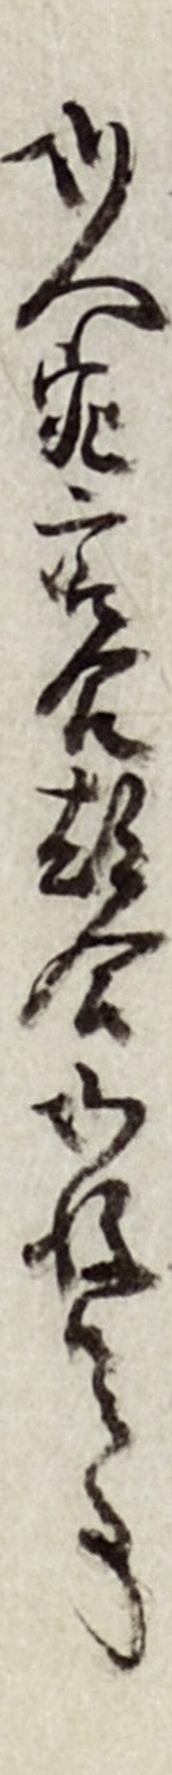弐人宛合都合弐枚之事」

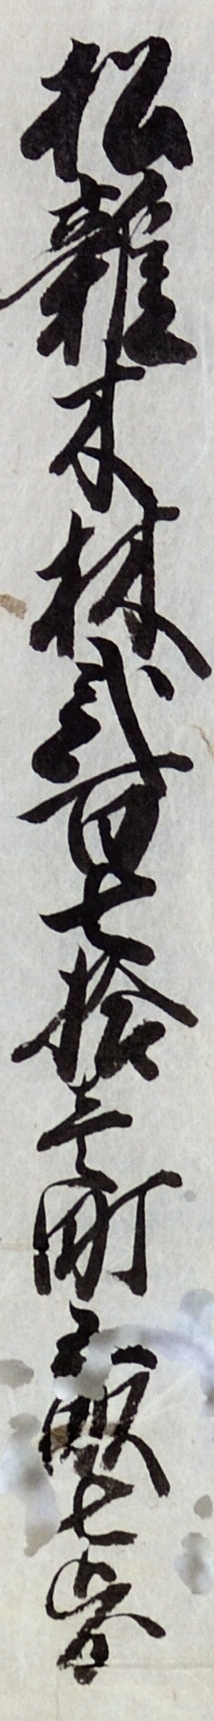松雑木林弐厘七拾壱町五畝七歩
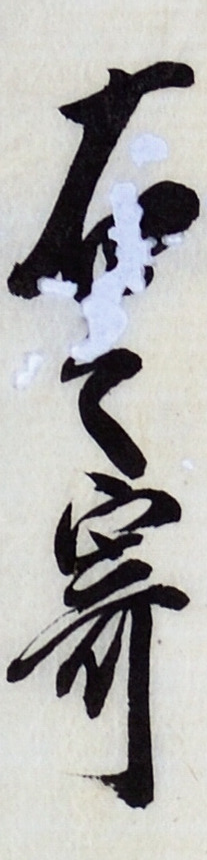右之寄
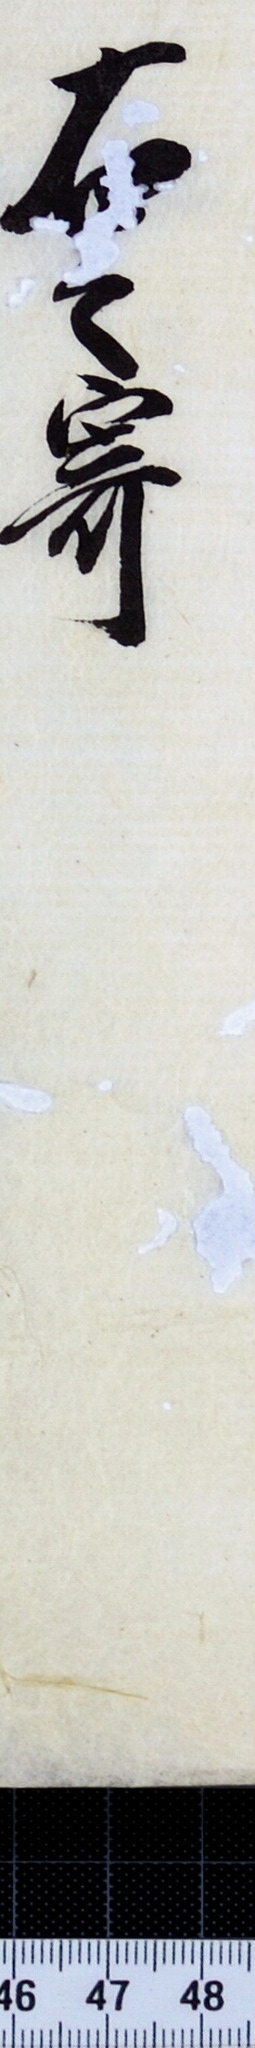右之寄
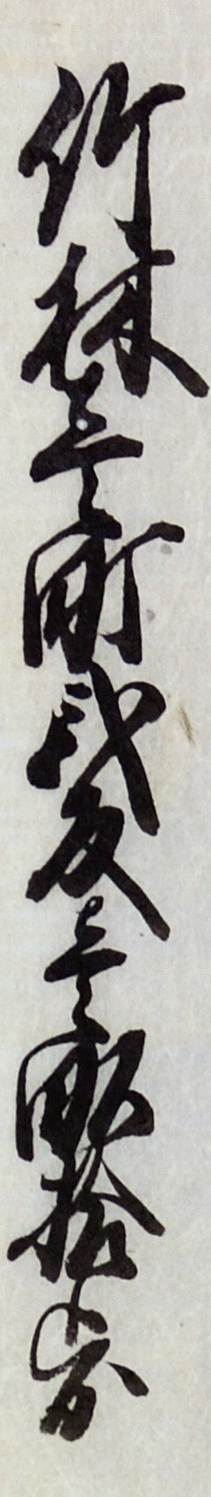竹林壱町弐反壱畝拾歩
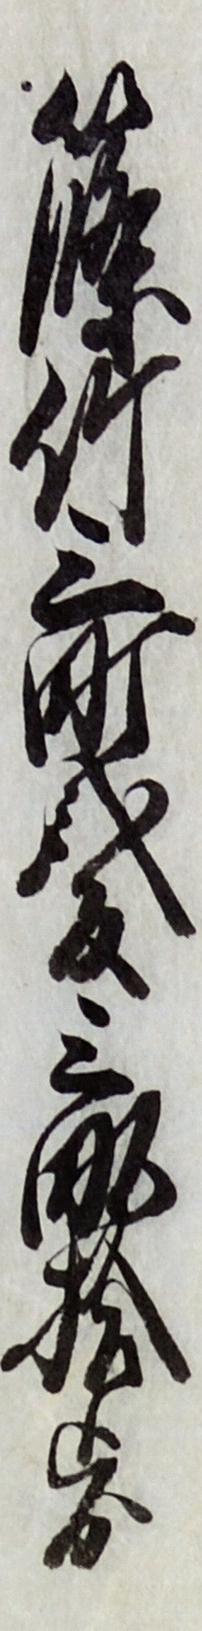篠竹三町弐反三畝拾歩
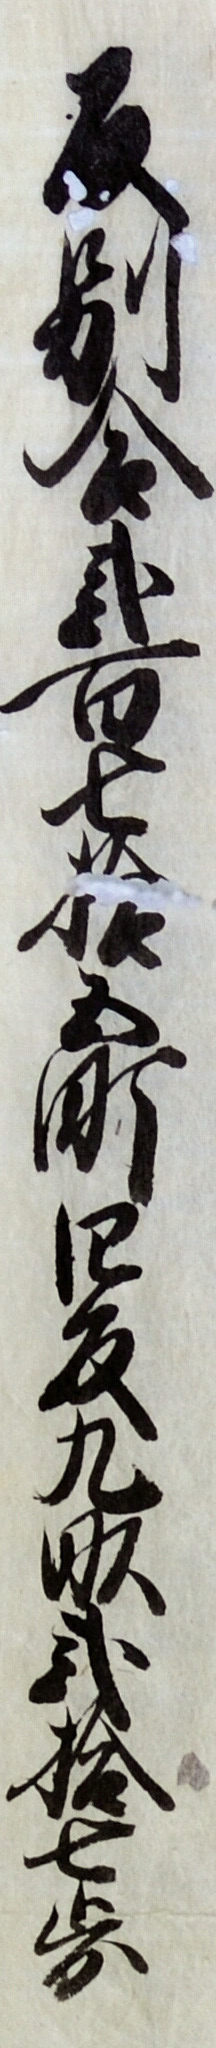反別合弐百七拾五町四反九畝弐拾七歩

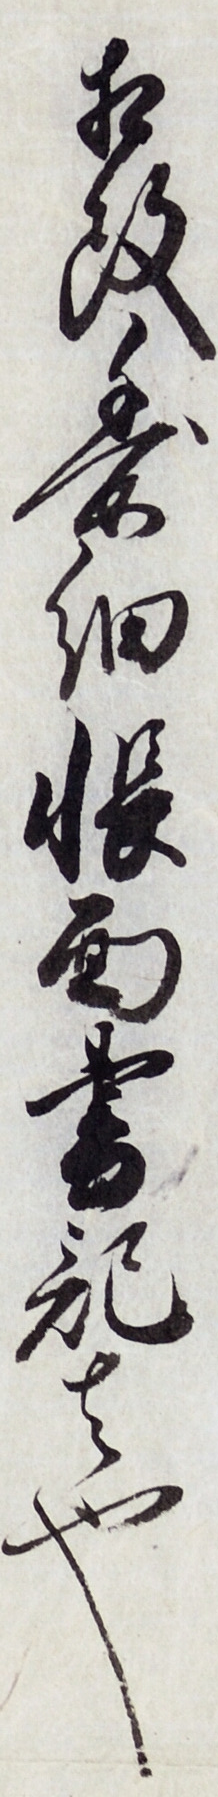相改委細帳面書記者也
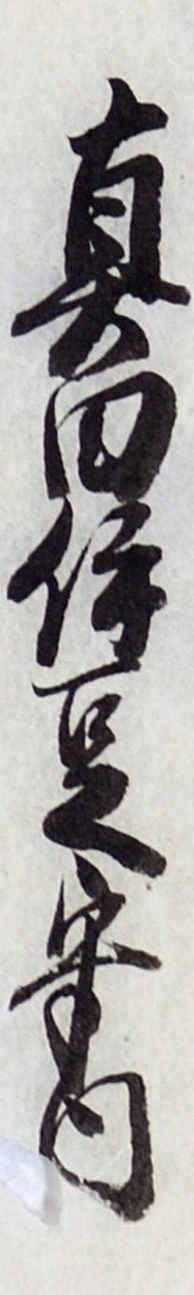真田伊豆守内
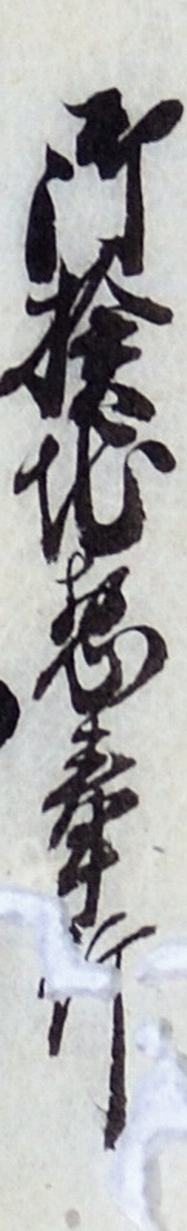御検地惣奉行
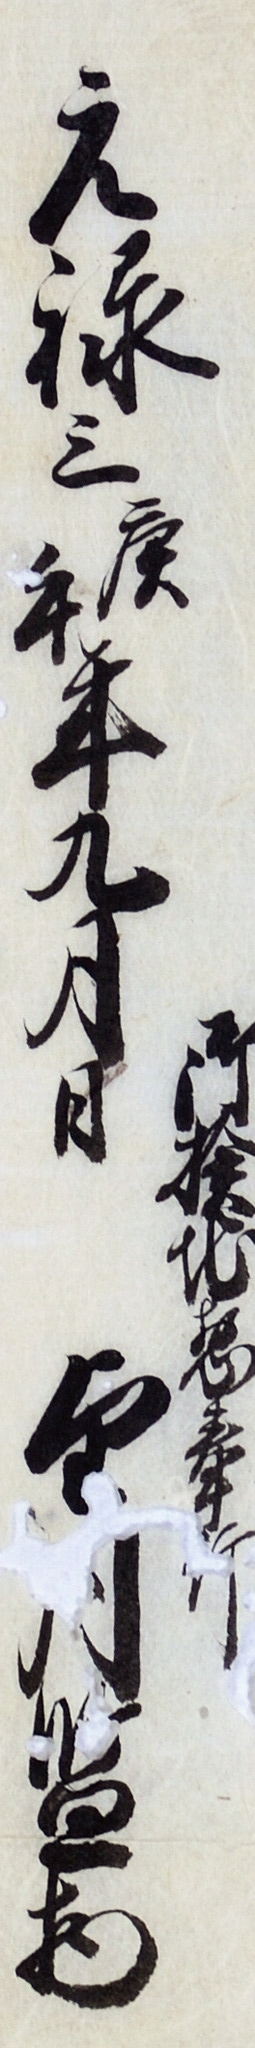元禄三庚午年九月日望月監物
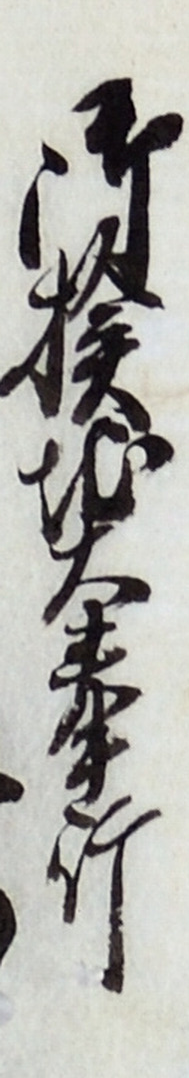御検地大奉行
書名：信濃国伊奈筑摩両郡村々御林改帳
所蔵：伊那市立高遠町図書館・合同会社AMANE
